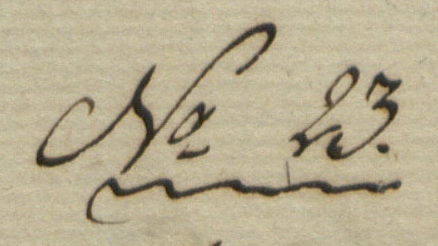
No 23.
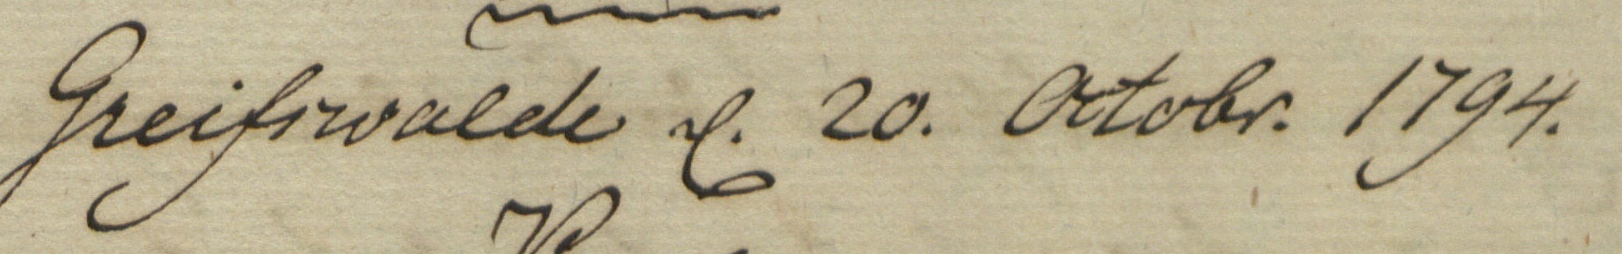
Greifswalde d. 20. Octobr. 1794.
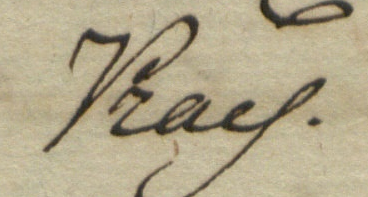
Praes.
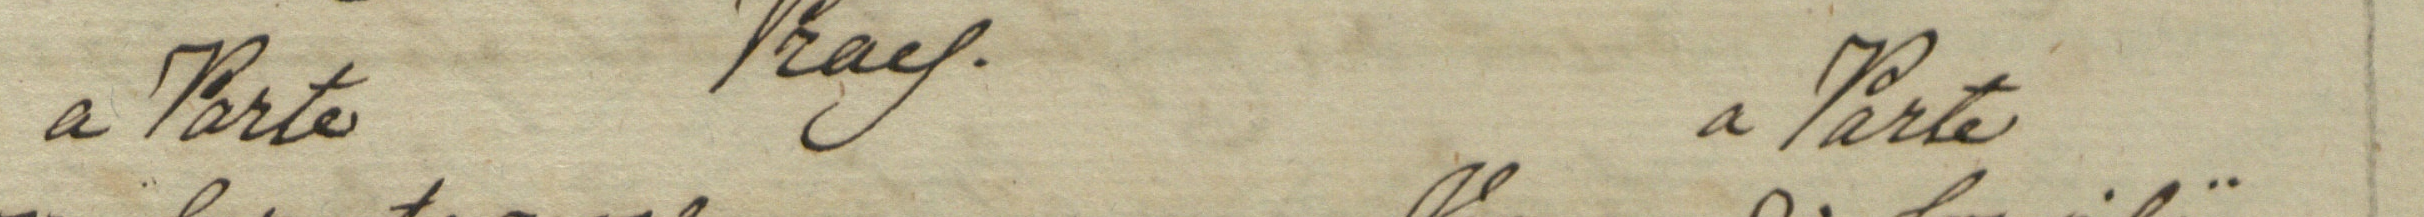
a Parte a Parte
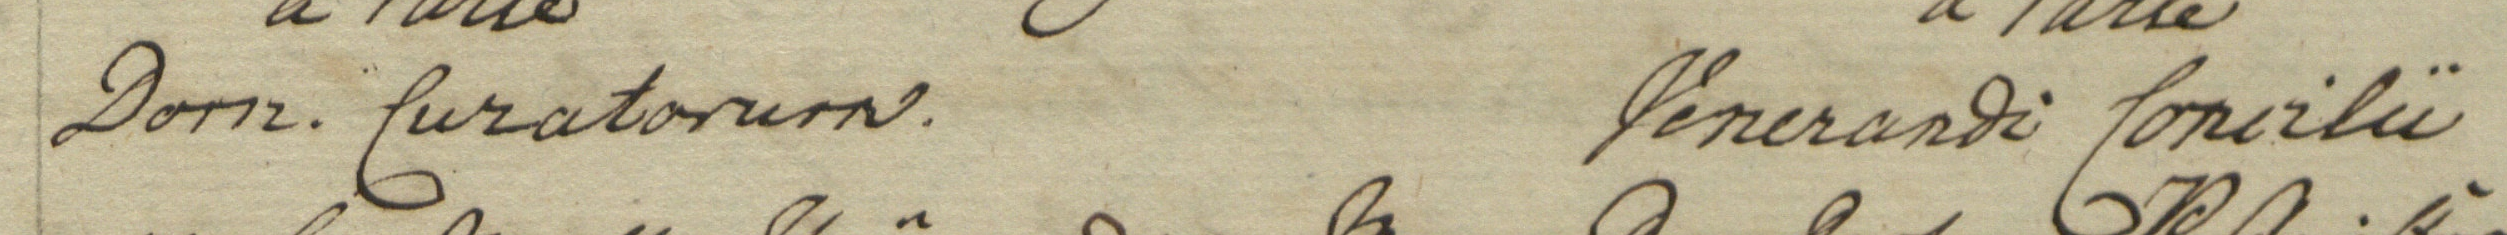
Dom. Curatorum. Venerandi Concilii
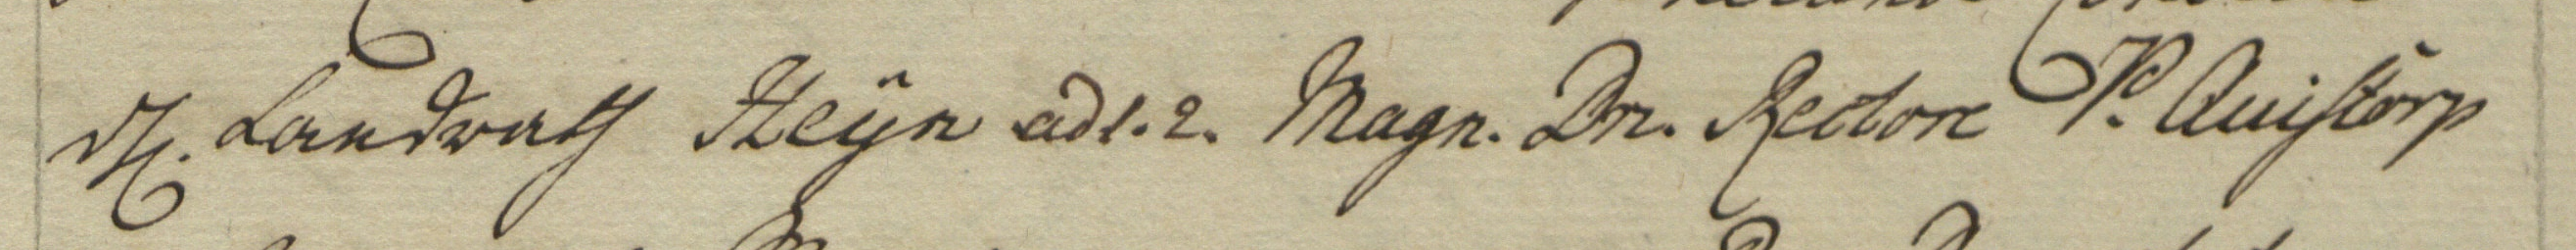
dh. Landrath Heÿn ad 1. 2. Magn. Dn. Rectore P. Quistorp
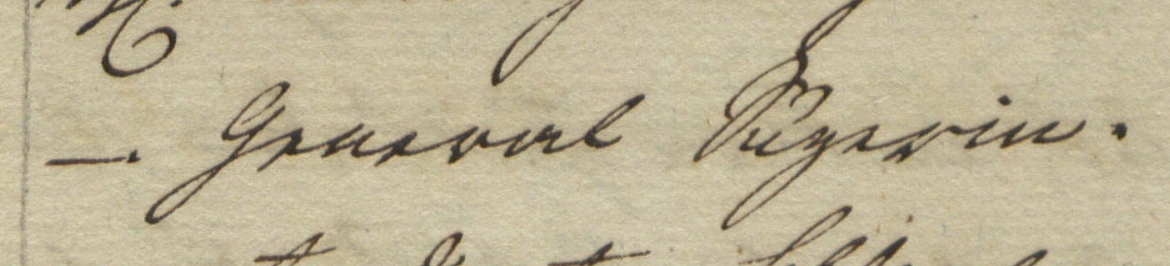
General Superint¬
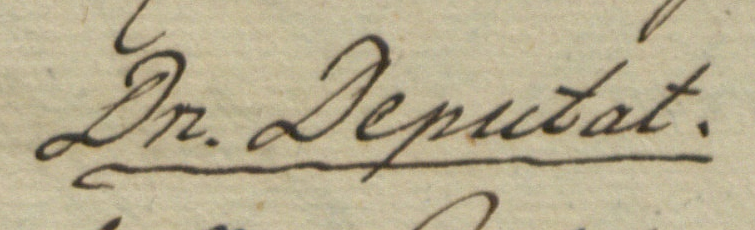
Dn. Deputat.
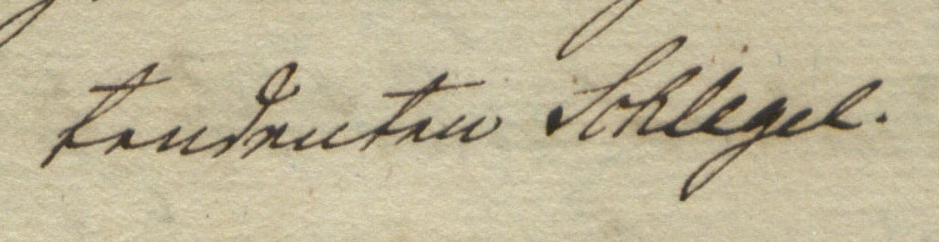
tendenten Schlegel.
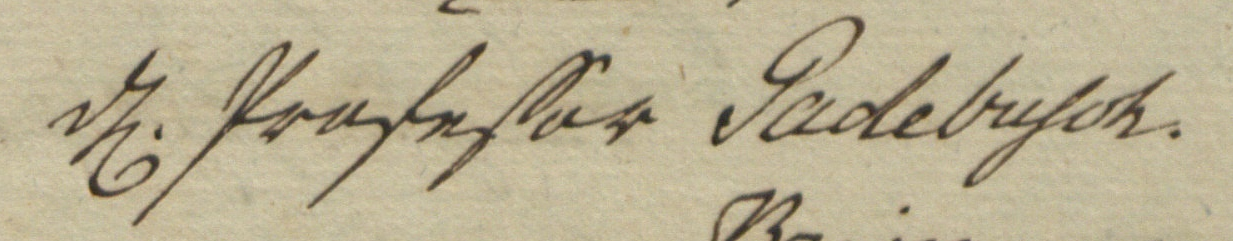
dh. Professor Gadebusch.
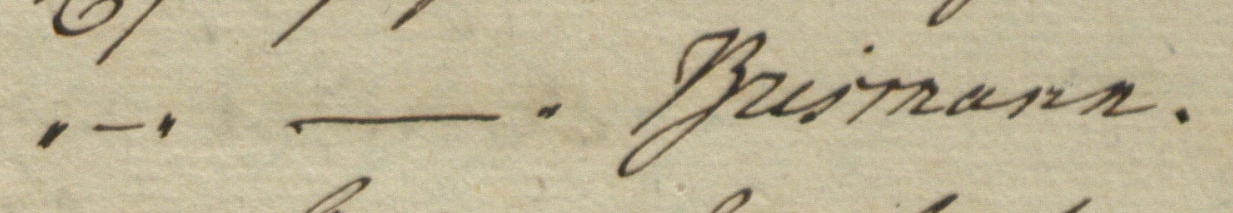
Brismann.
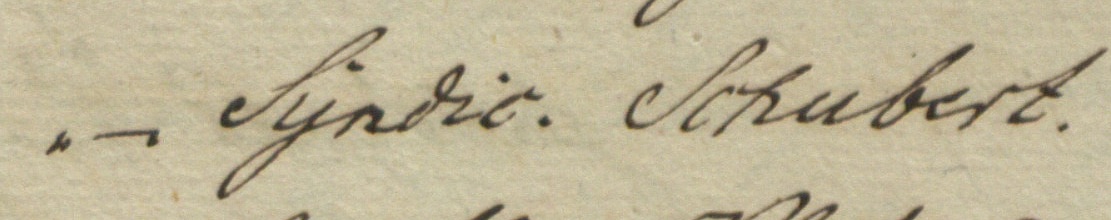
Sÿndic. Schubert.
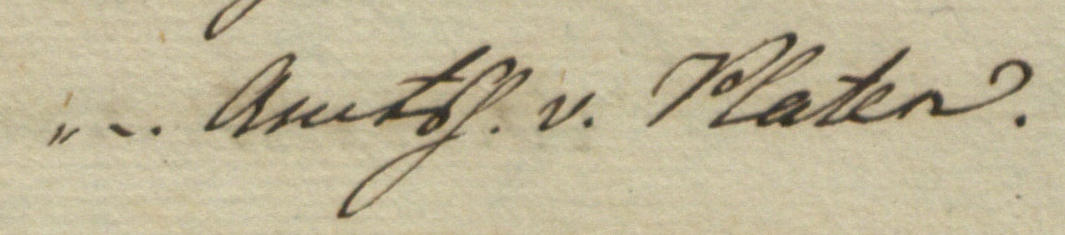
Amtsh. v. Platen.
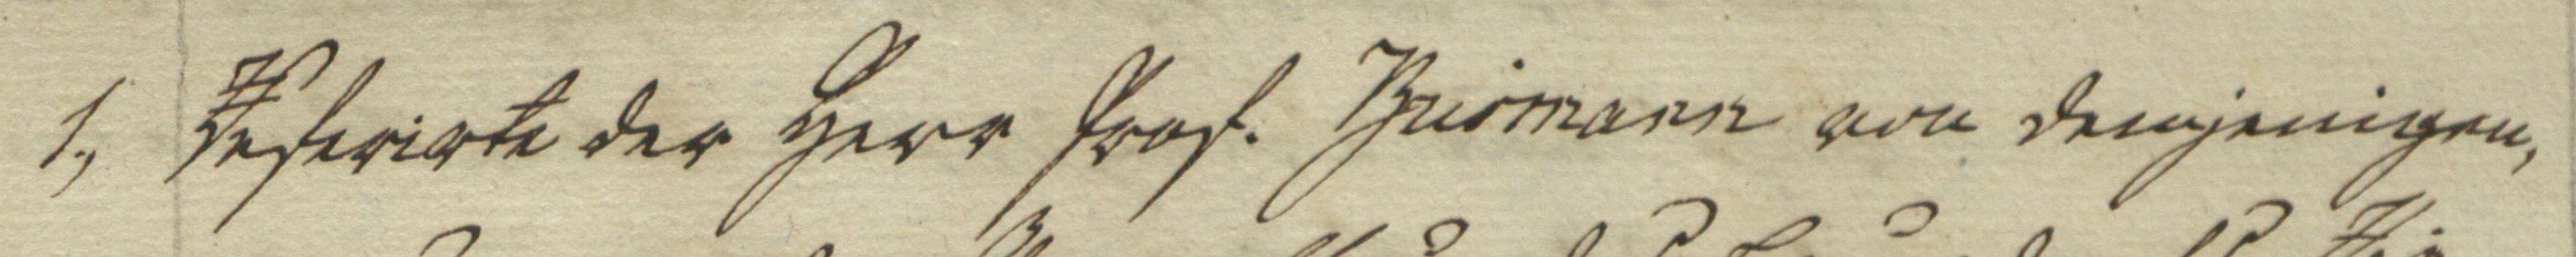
1., Referirte der Herr Prof. Brismann von demjenigen,
